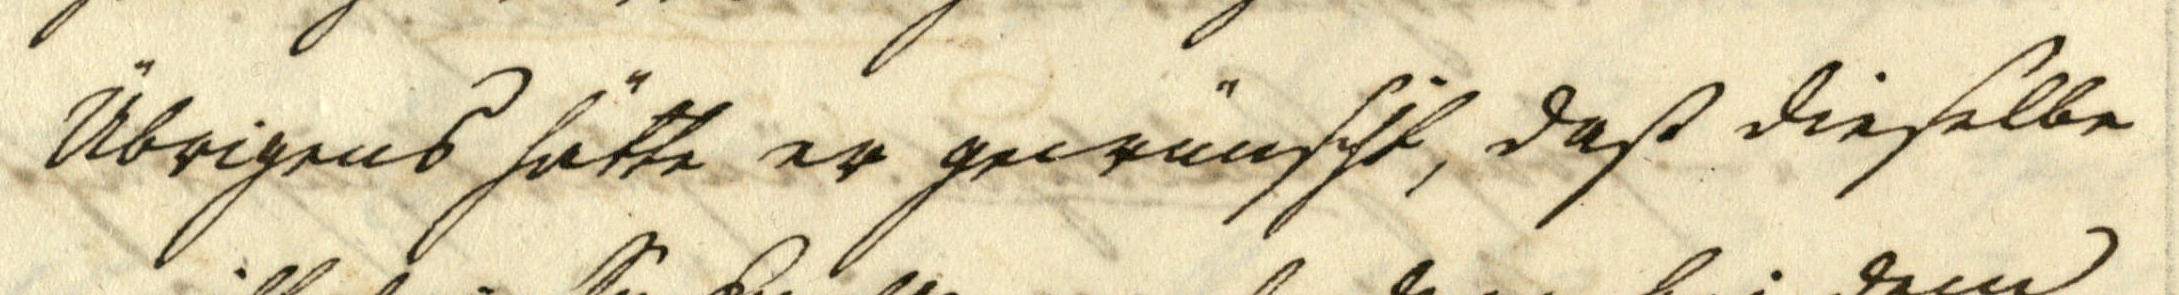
Übrigens hätte er gewünscht, daß dieselbe
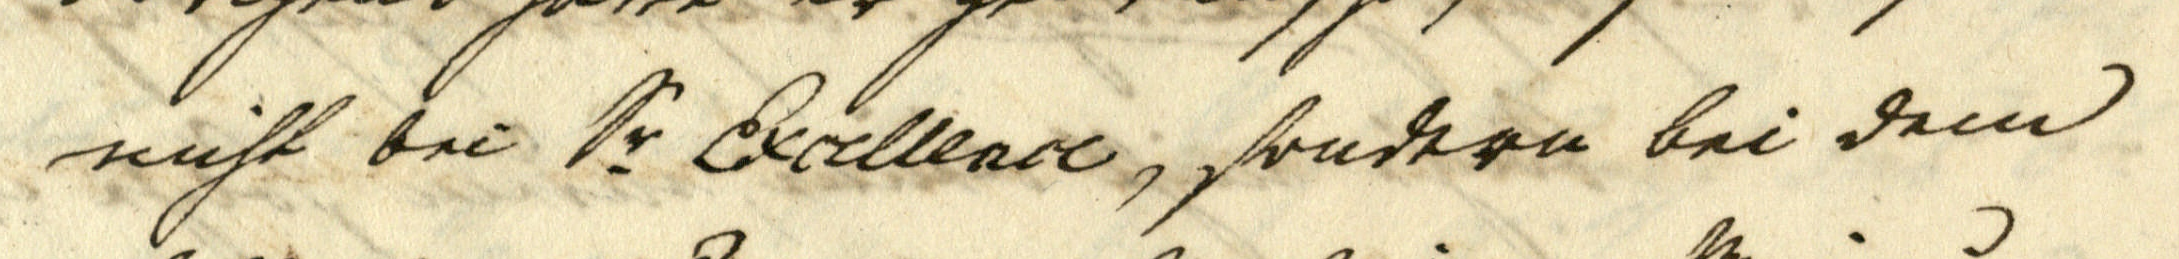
nicht bei Sr Excellence, sondern bei dem
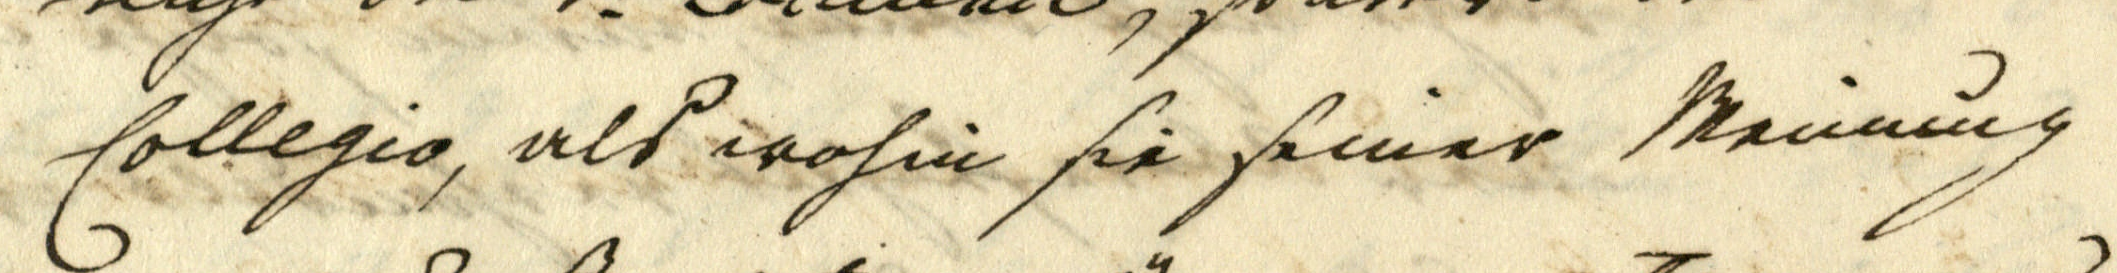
Collegio, als wohin sie seiner Meinung
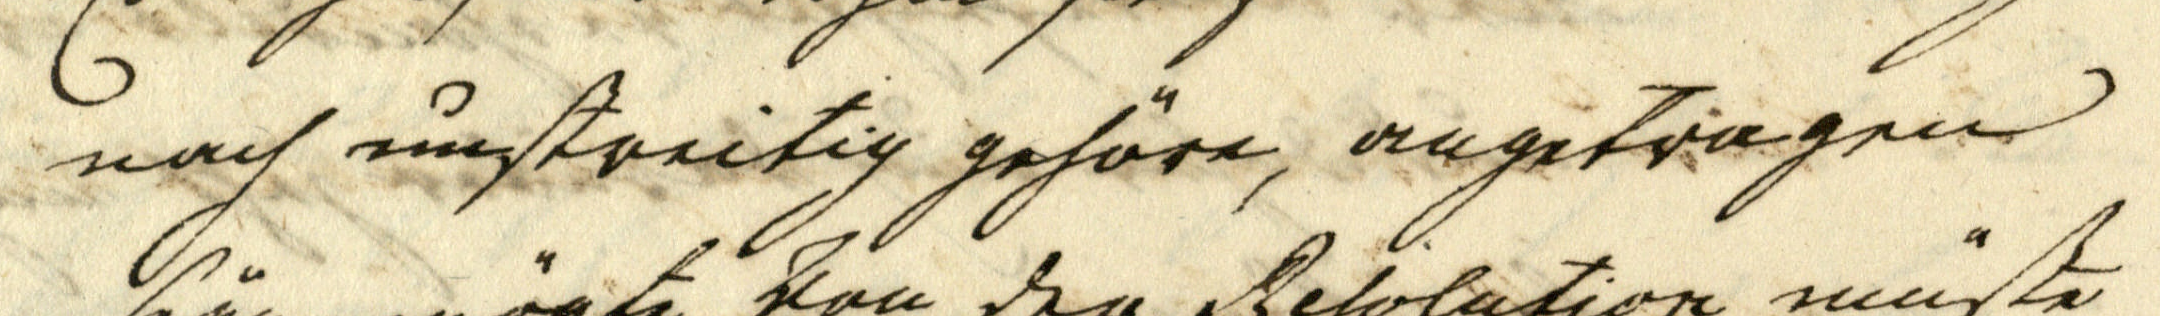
nach unstreitig gehöre, angetragen
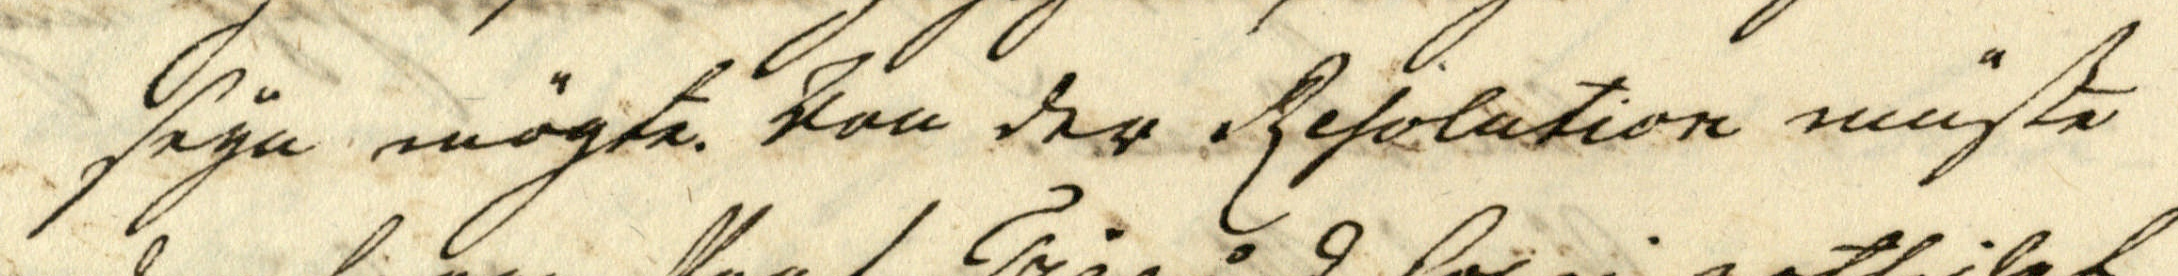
seÿn mögte. Von der Resolution müßte
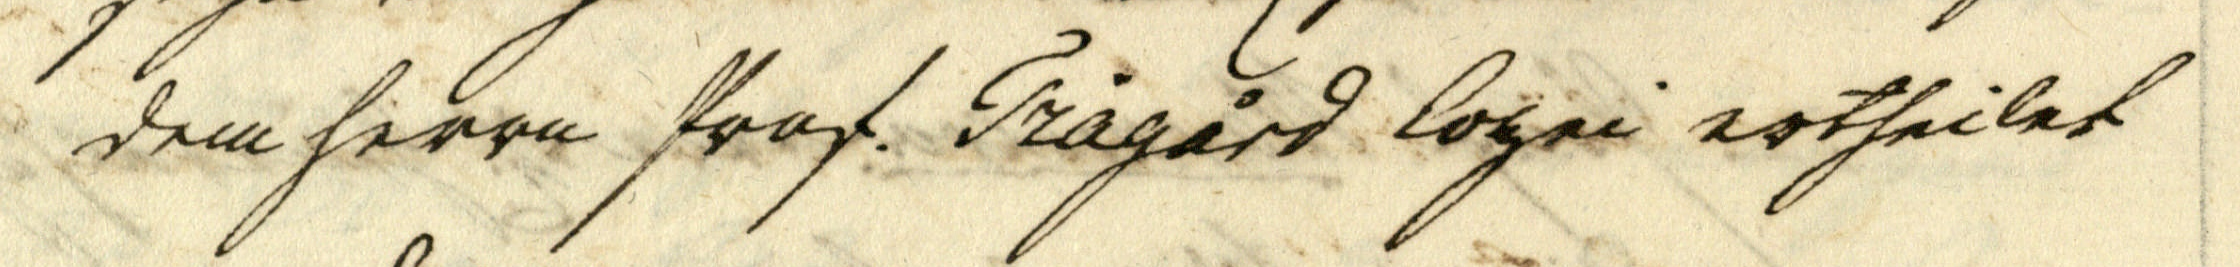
dem Herrn Prof. Trägård Copei ertheilet
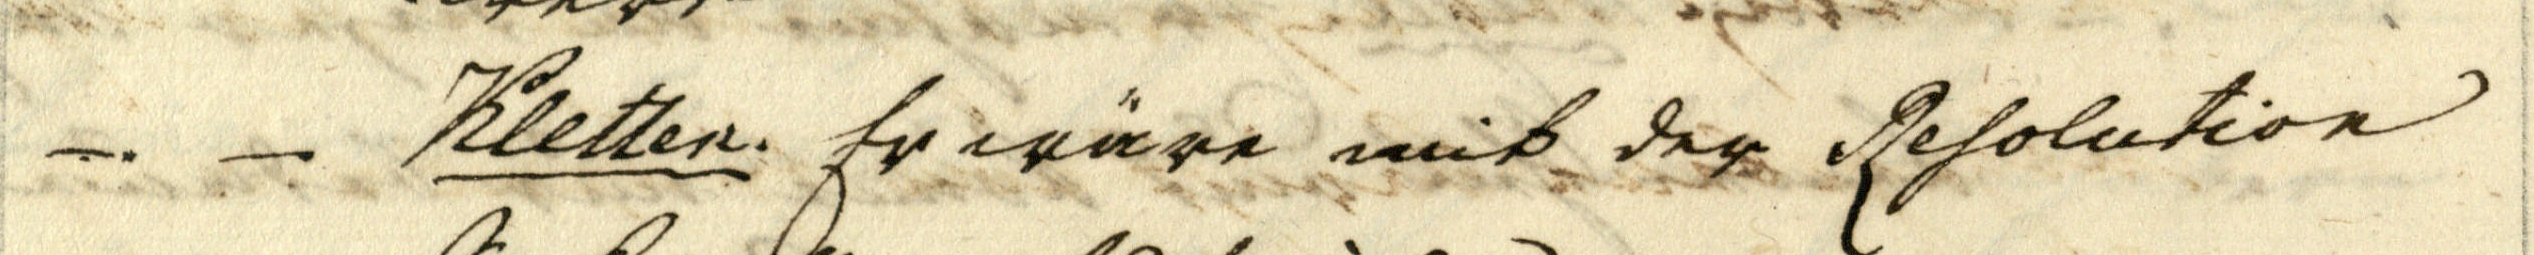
Kletten. Er wäre mit der Resolution
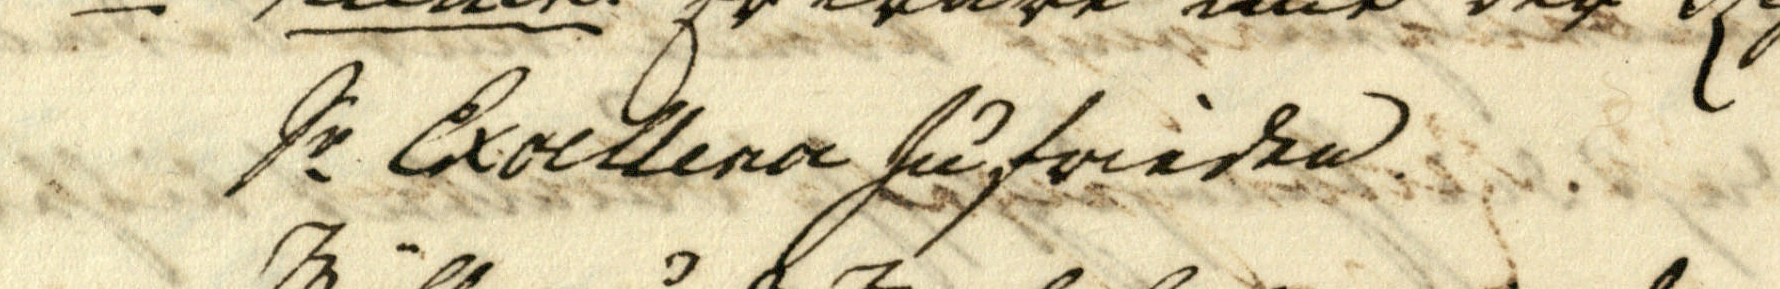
Sr Excellence zufrieden.
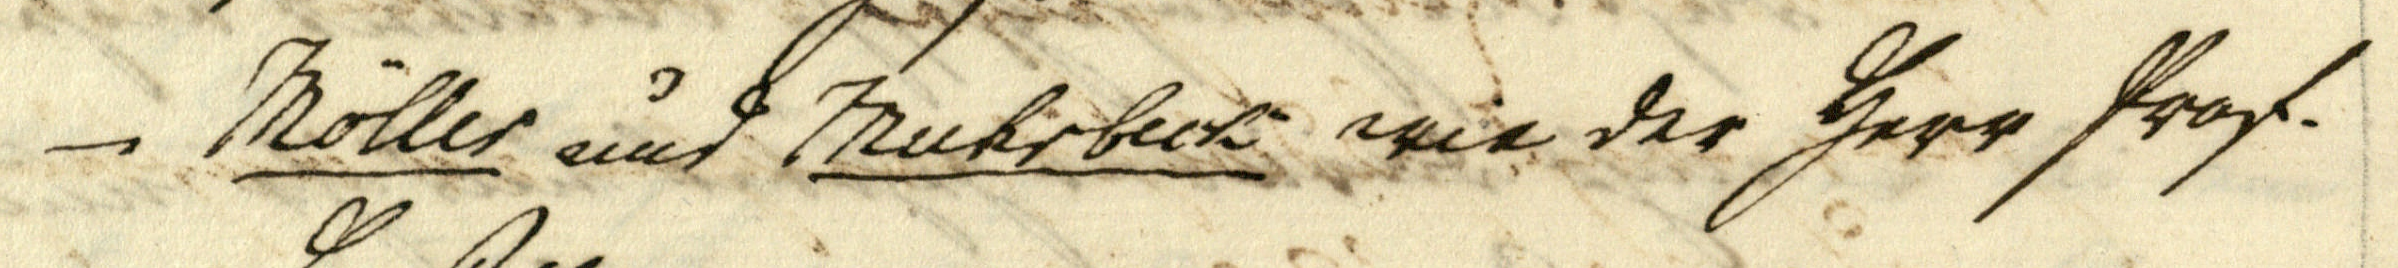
Möller und Muhrbeck wie der Herr Prof.
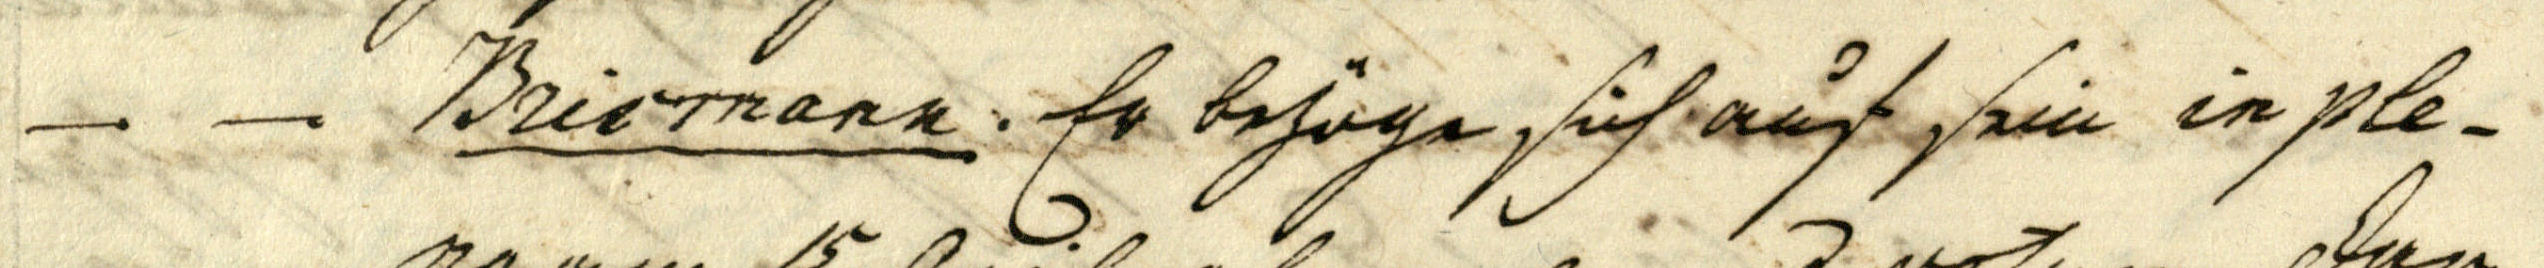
Brismann. Er bezöge sich auf sein in ple¬
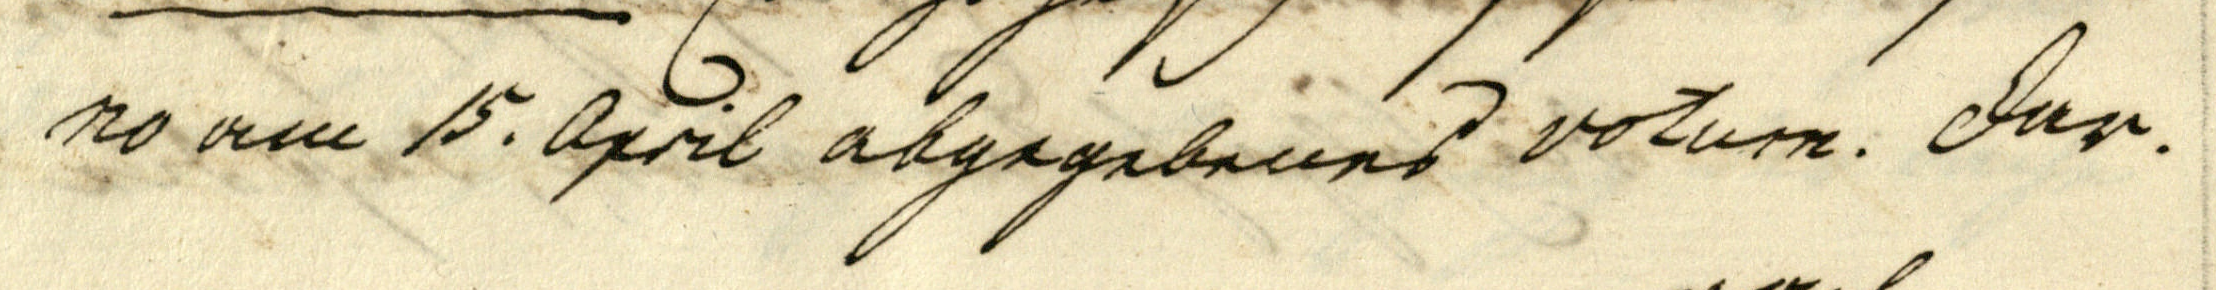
no am 15. April abgegebenes votum. Dar¬
